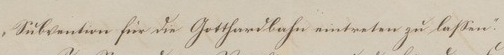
Subvention für die Gotthardbahn eintreten zu laßen.»
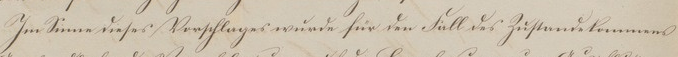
Im Sinne dieses Vorschlages wurde für den Fall des Zustandekommens
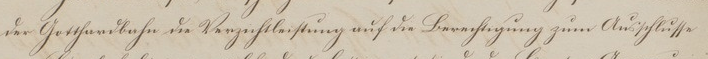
der Gotthardbahn die Verzichtleistung auf die Berechtigung zum Ausschlusse
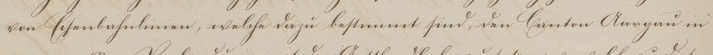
von Eisenbahnlinien, welche dazu bestimmt sind, den Canton Aargau in
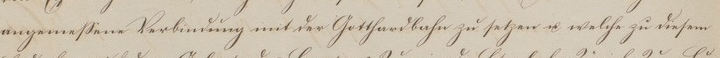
angemeßene Verbindung mit der Gotthardbahn zu setzen & welche zu diesem
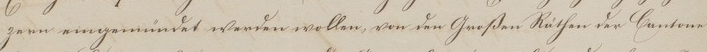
zern eingemündet werden wollen, von den Großen Räthen der Cantone
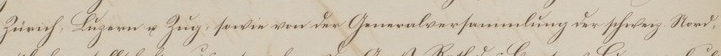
Zürich, Luzern & Zug, sowie von der Generalversammlung der schweiz. Nord-
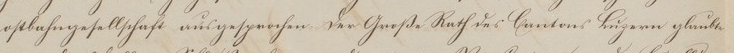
ostbahngesellschaft ausgesprochen. Der Große Rath des Cantons Luzern glaubte
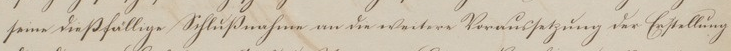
seine dießfällige Schlußnahme an die weitere Voraussetzung der Erstellung
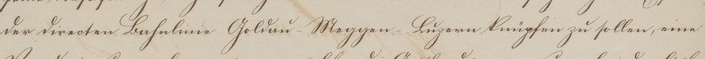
der directen Bahnlinie Goldau–Meggen–Luzern knüpfen zu sollen, eine
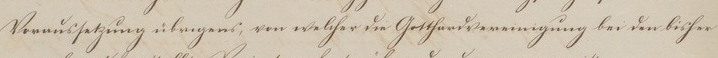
Voraussetzung übrigens, von welcher die Gotthardvereinigung bei den bisher
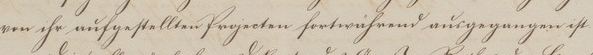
von ihr aufgestellten Projecten fortwährend ausgegangen ist.
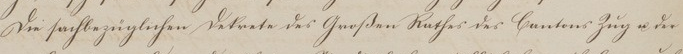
Die sachbezüglichen Dekrete des Großen Rathes des Cantons Zug & der
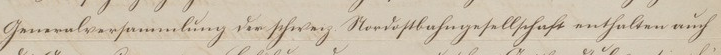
Generalversammlung der schweiz. Nordostbahngesellschaft enthalten auch
